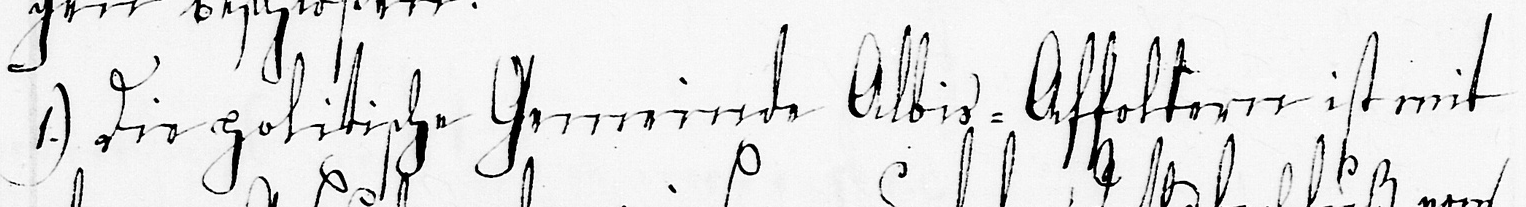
1.) Die politische Gemeinde Albis-Affoltern ist mit
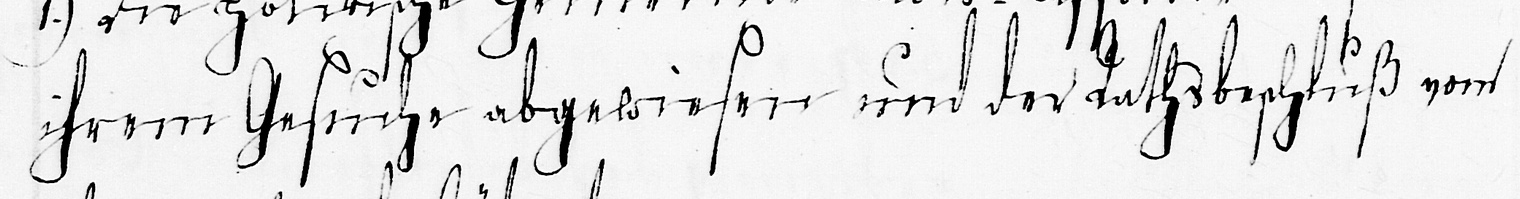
ihrem Gesuche abgewiesen und der Rathsbeschluß vom
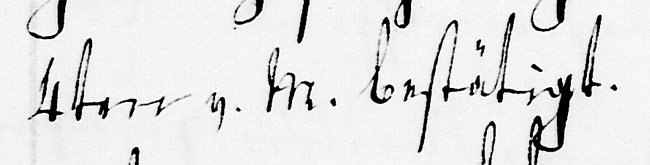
4ten v. M. bestätigt.
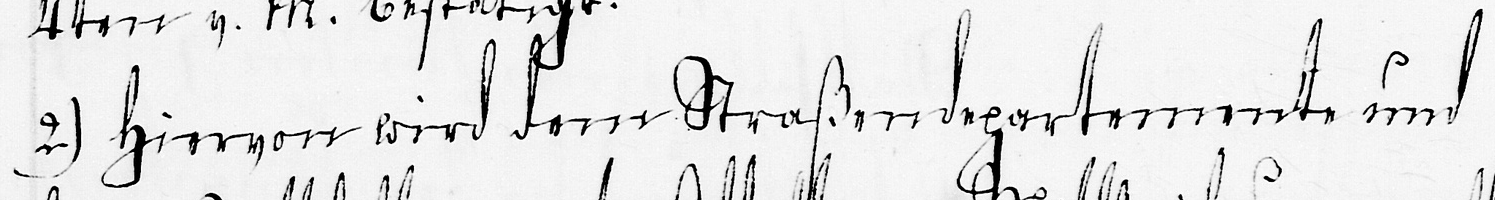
2.) Hiervon wird dem Straßendepartemente und
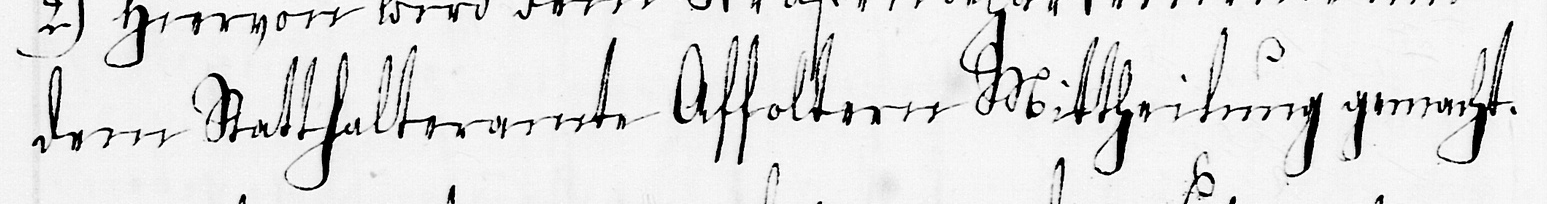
dem Statthalteramte Affoltern Mittheilung gemacht.
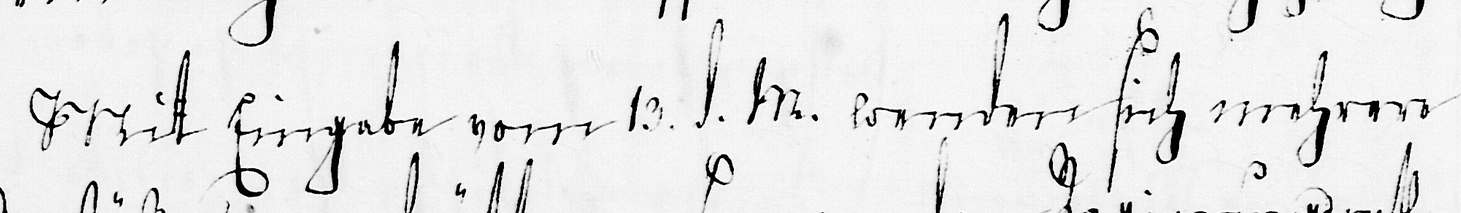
Mit Eingabe vom 13. d. M. wenden sich mehrere
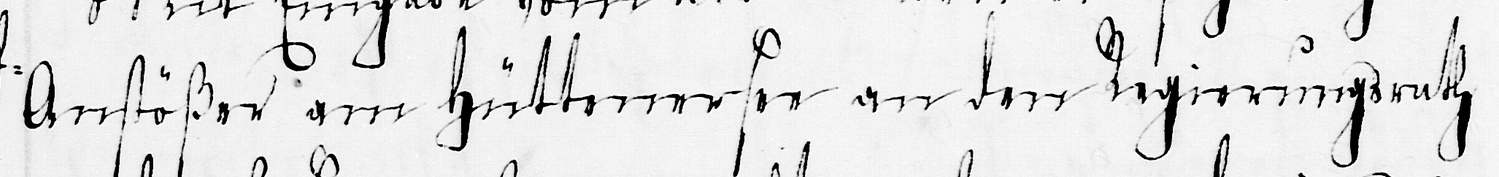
Anstößer am Hüttenersee an den Regierungsrath
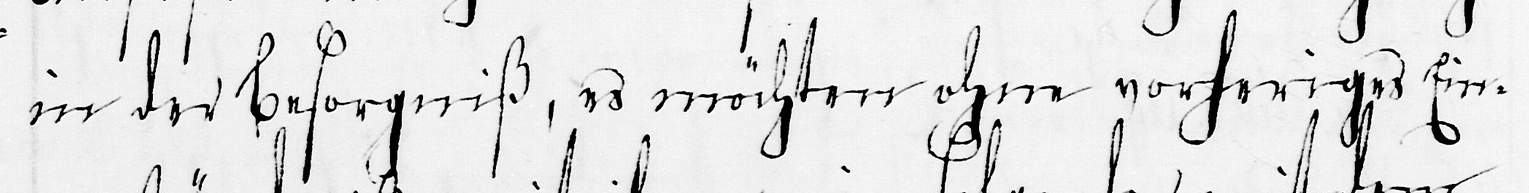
in der Besorgniß, es möchten ohne vorheriges Ein¬
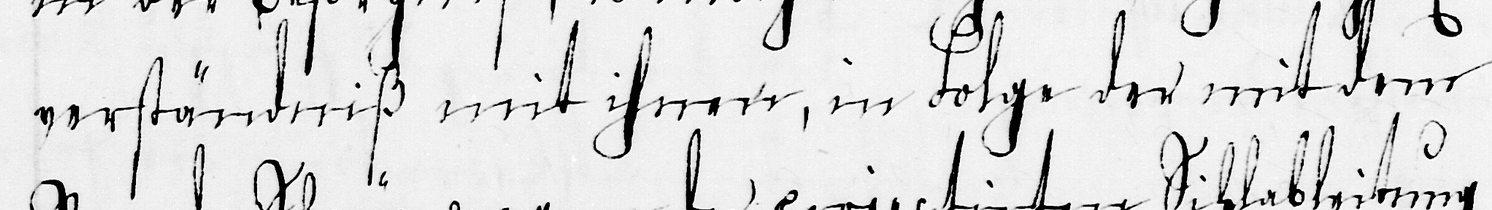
verständniß mit ihnen, in Folge der mit dem
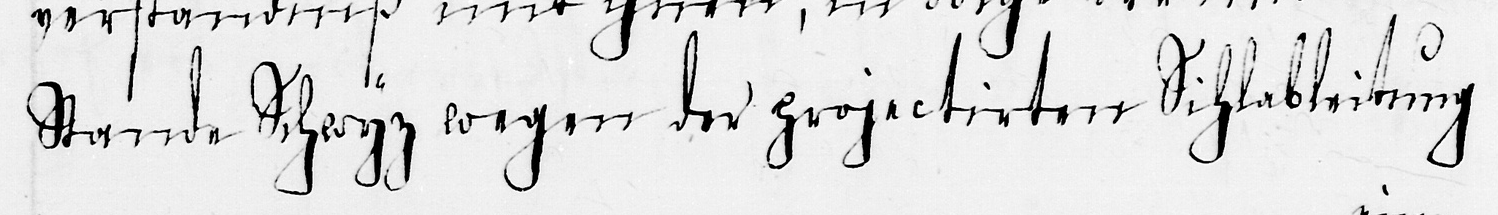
Stande Schwyz wegen der projectirten Sihlableitung
